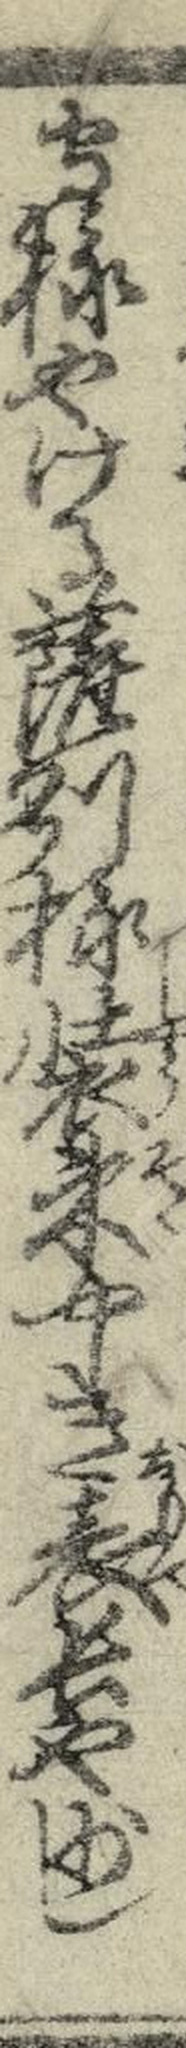守様やける薩州様装束やしき表長や少し
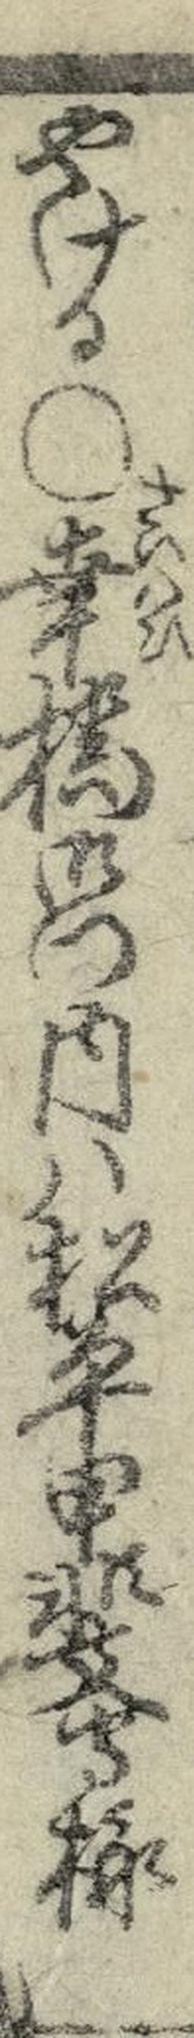やける〇幸橋御門内ハ松平甲斐守様
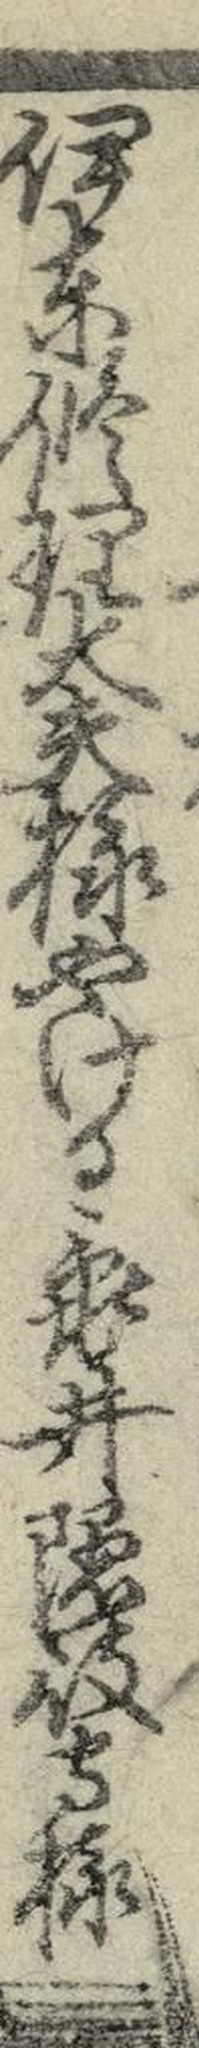伊奈修理大夫様やける亀井隠岐守様
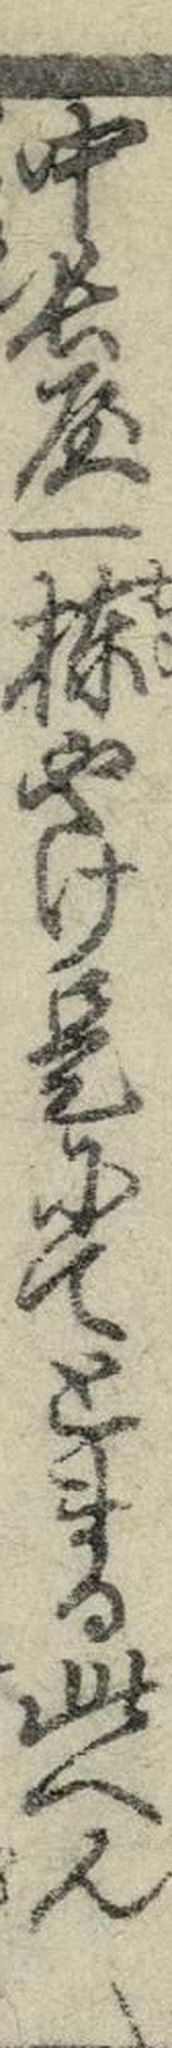中長屋一棟やけ是にてとまる此へん
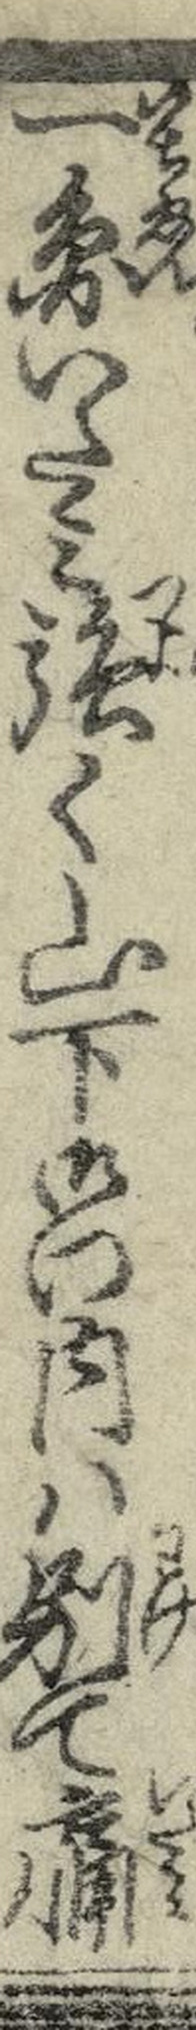一圓いたみ強く山下御門内ハ別て痛
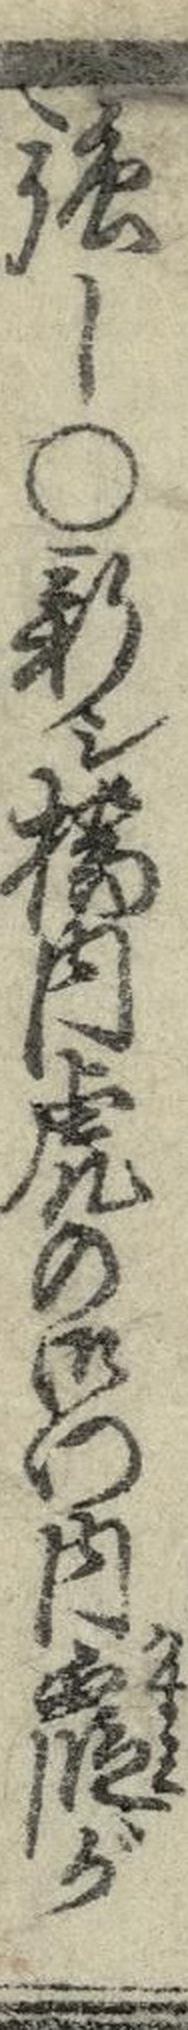強し〇新シ橋内虎の御門内霞が
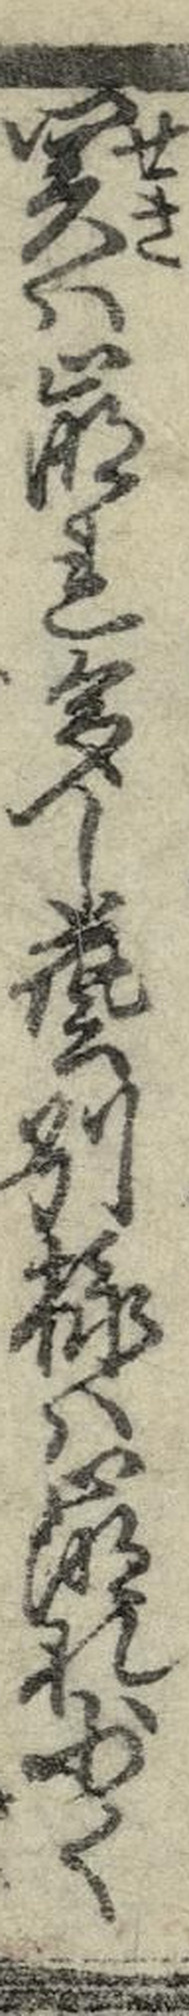関ハ崩れ多し芸州様ハ崩れ少く
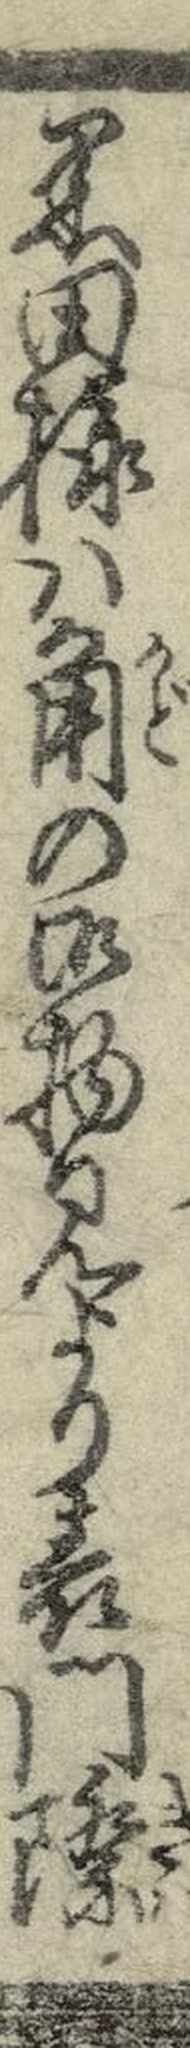黒田様ハ角の御物見より表門際
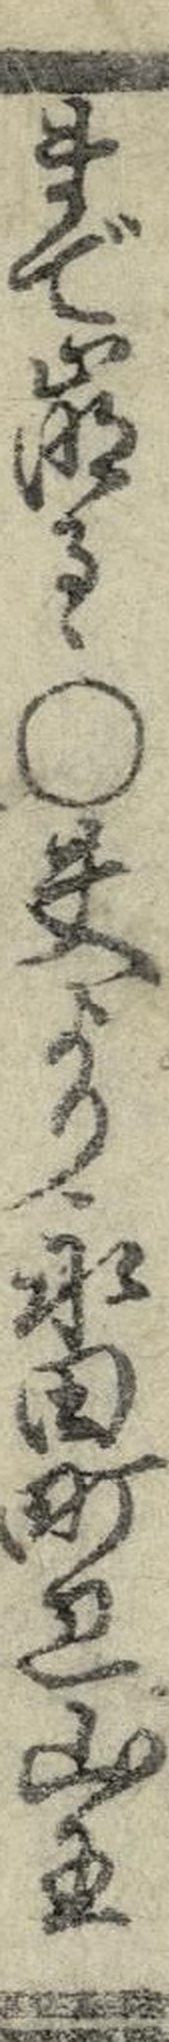まで崩るゝ〇夫より永田町辺山王
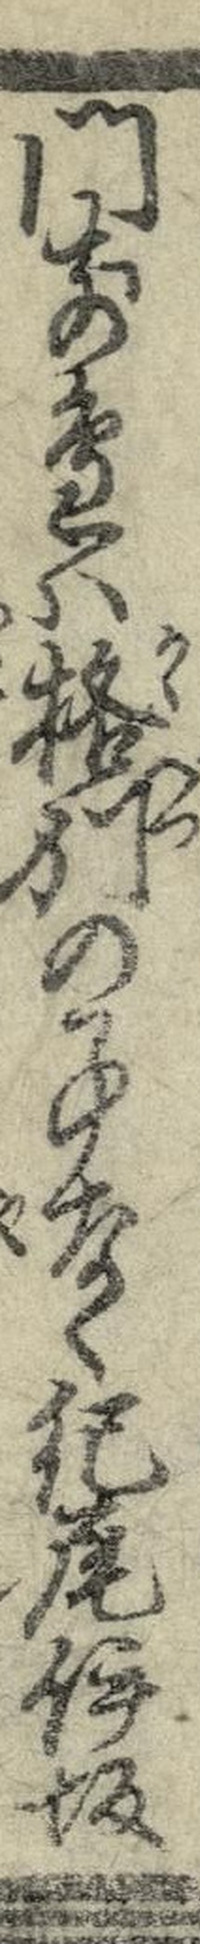門前辺ハ格別の事なく紀尾伊坂
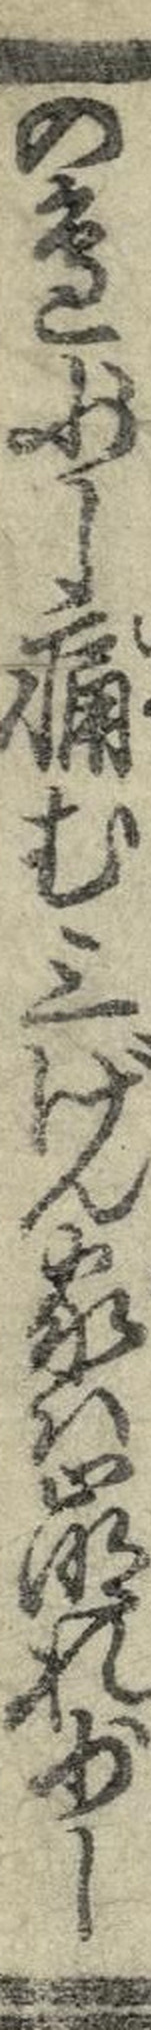の辺少し痛む三げん家ハ崩れ少し
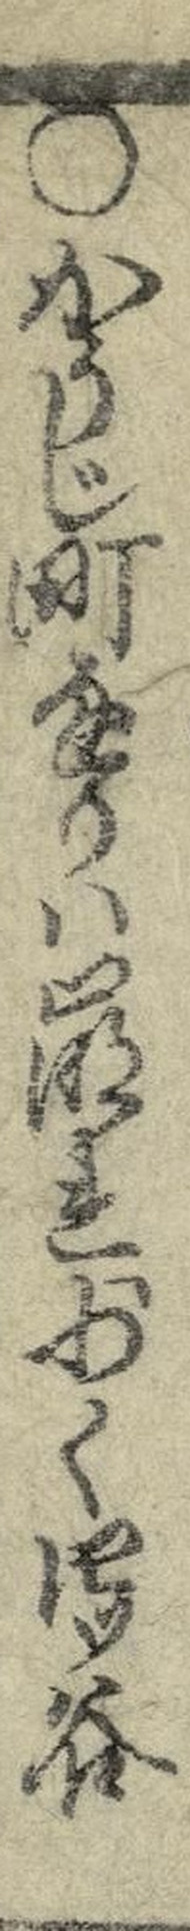〇かうじ町通りハ崩れ少く四ツ谷

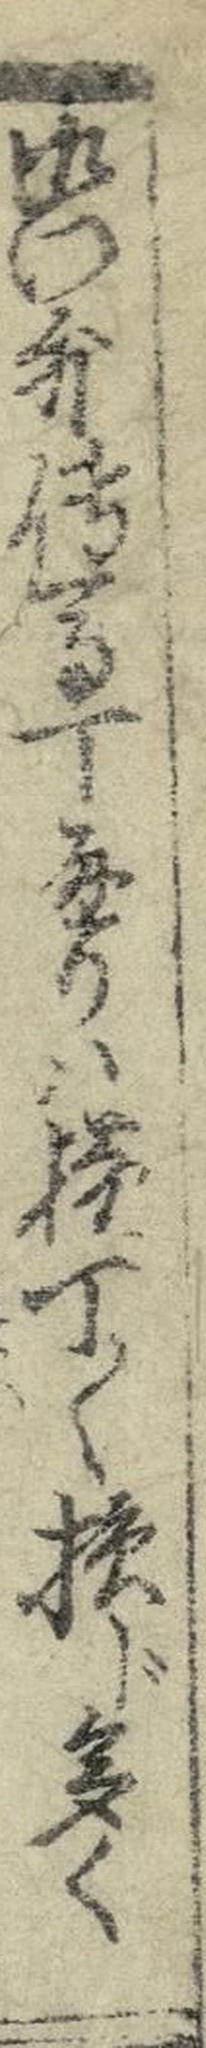御門外伝馬丁通りは横丁〳〵損じ多く
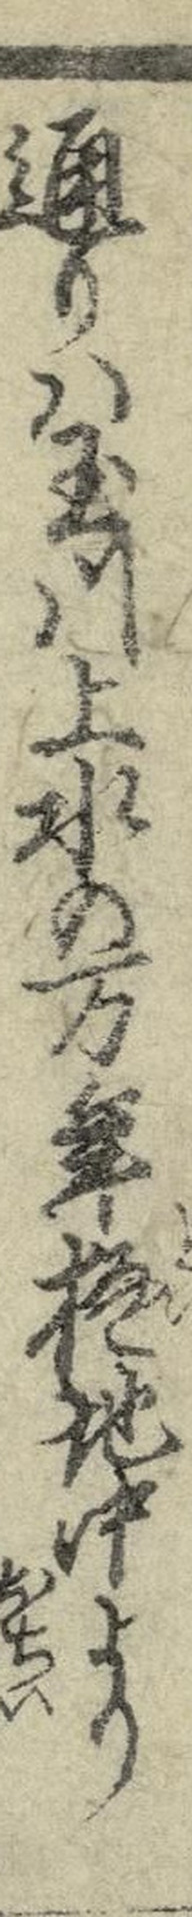通りは玉川上水の万年樋地中より
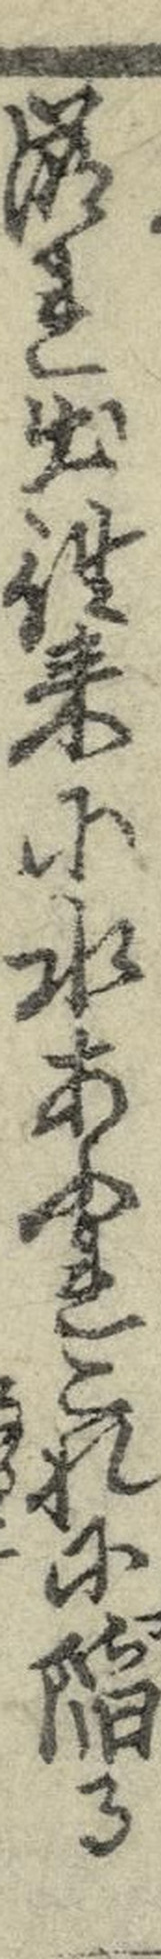崩れ出往来に水あふれこれに陥る
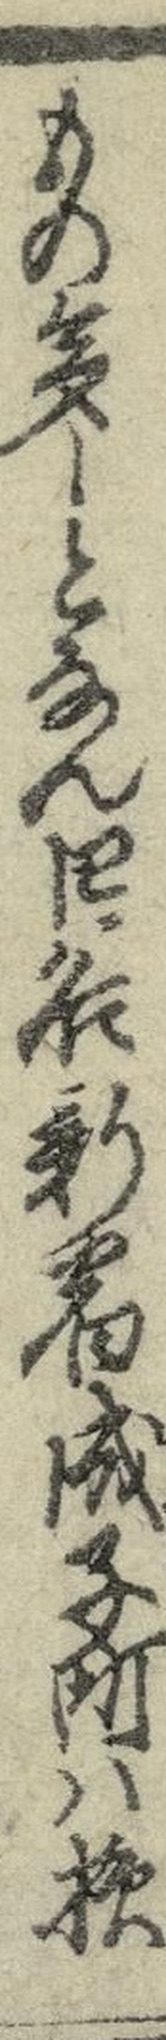もの多しとなん四谷新宿成子町は損
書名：地震並出火細見記
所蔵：東京大学地震研究所図書室 Earthquake Research Institute Library, The University of Tokyo, JAPAN
